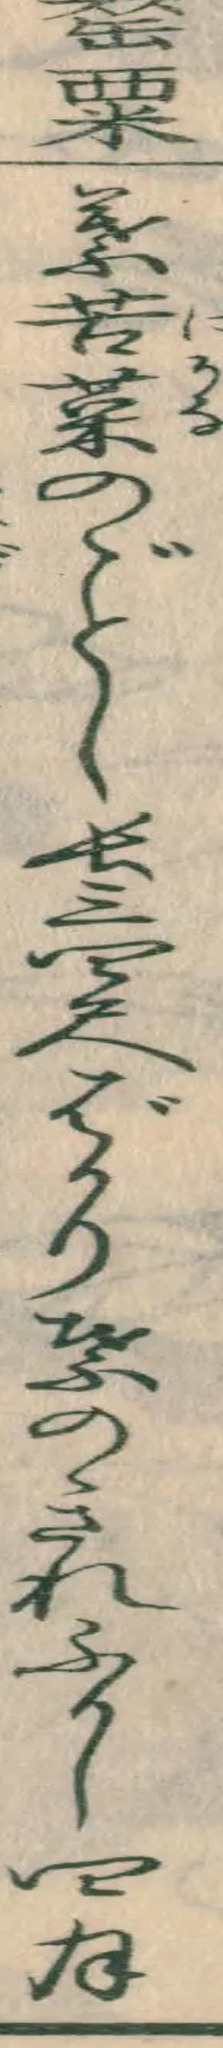葉苦菜のごとし長三四尺ばかり葉のきれふかし四月
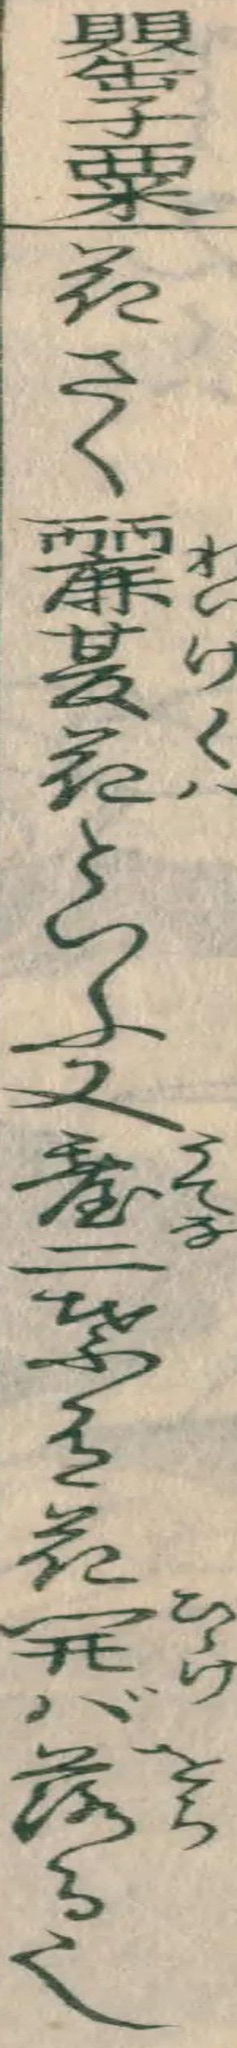花さく麗夏花といふ又台二葉有花開ば落る也
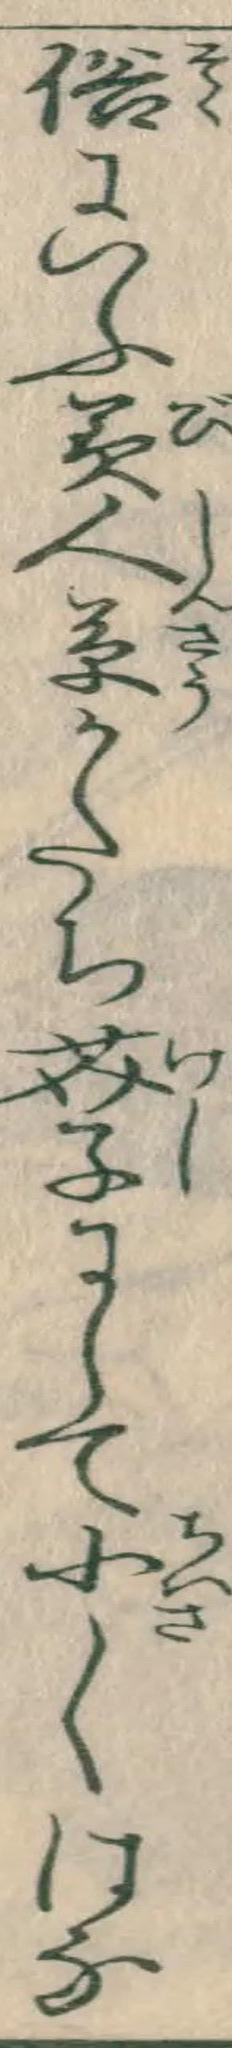俗にいふ美人草かたち芥子にして小くはな
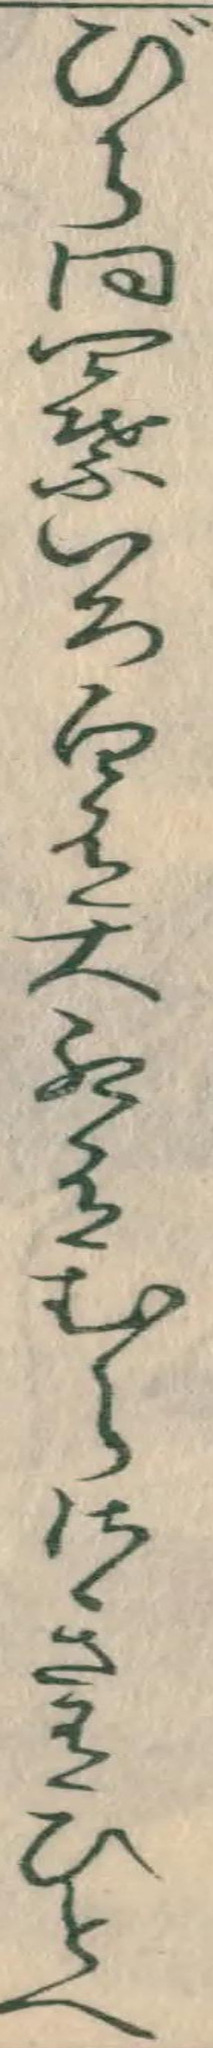びら同四葉いろ白有大紅有むらさき有ひとへ
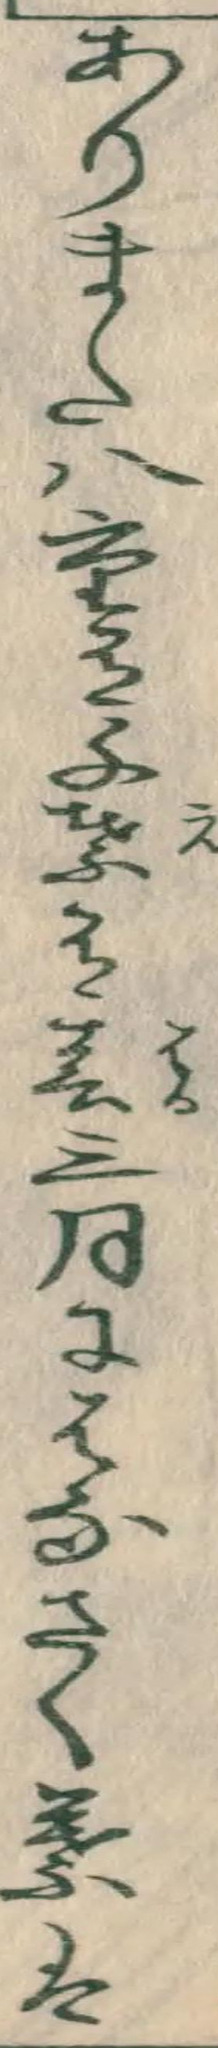ありまた八重有千葉有春三月にはなさく葉は
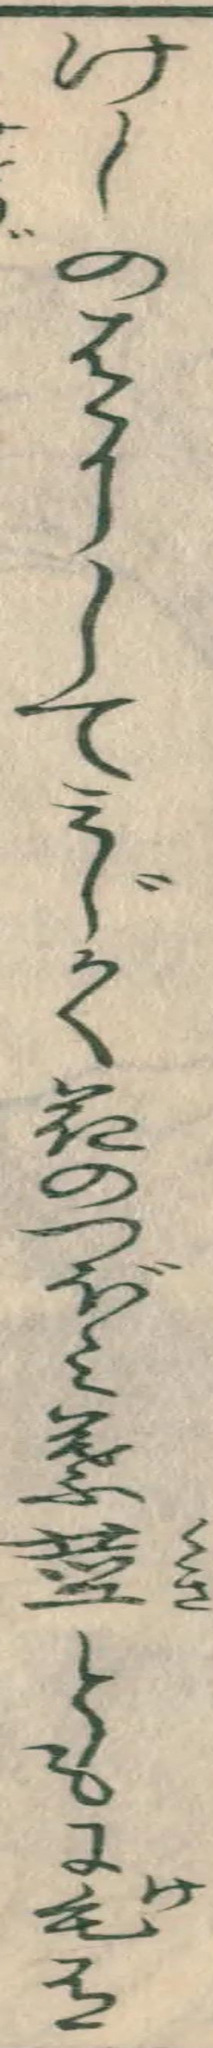けしのはにしてみじかく花のつぼみ葉茎ともに毛有
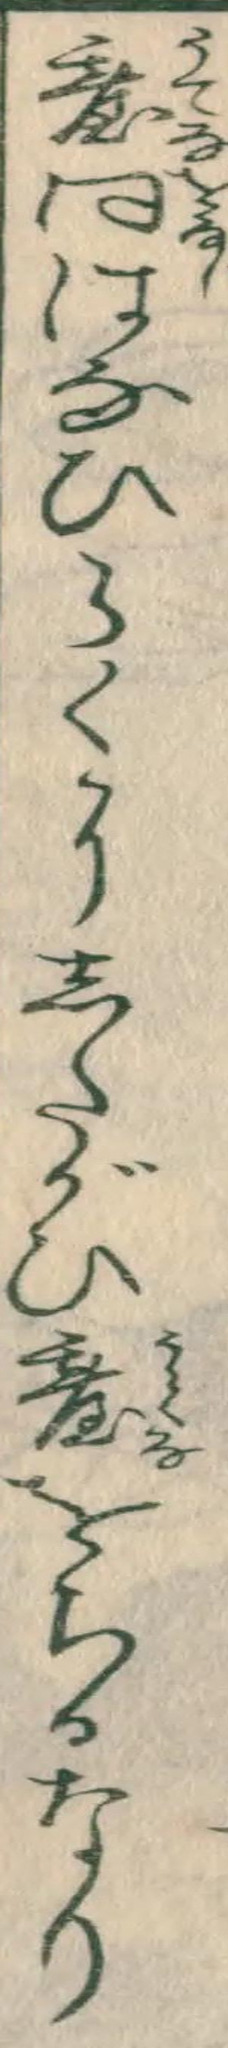台同はなひらくにしたがひ台をちるなり

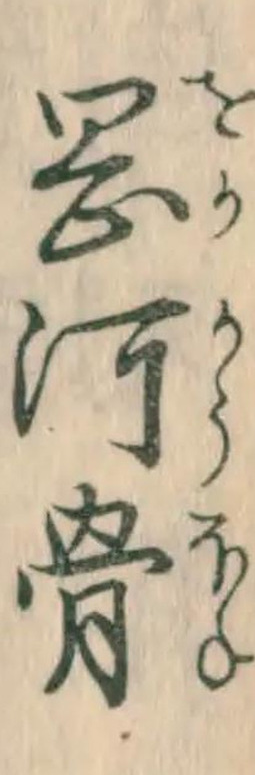岡河骨
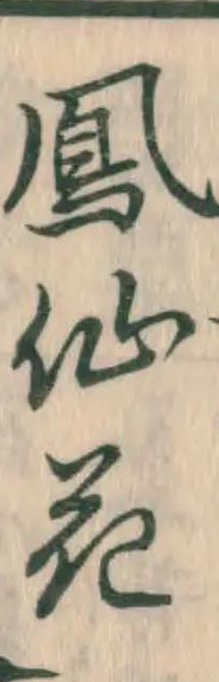鳳仙花
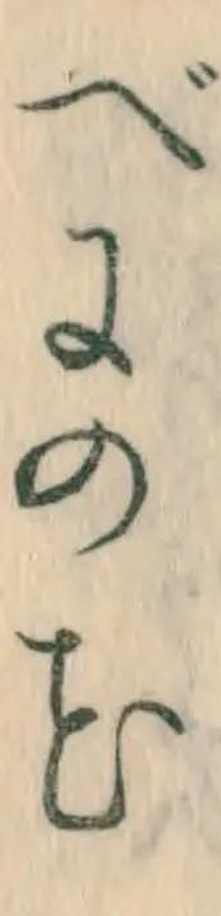べにの花

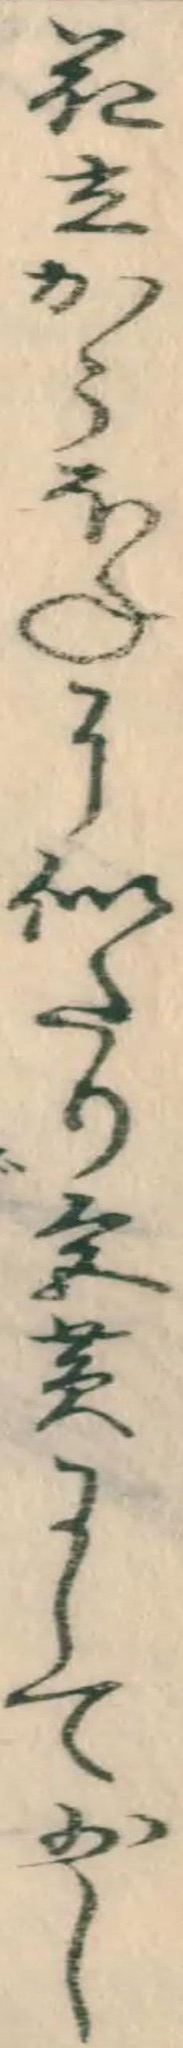花立かうほねに似たり色黄にして少し
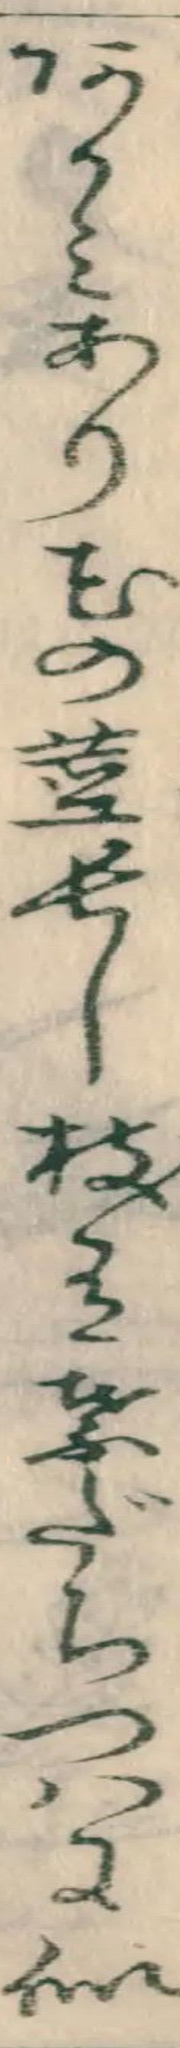あかみあり花の茎長し枝有葉だちつはに似
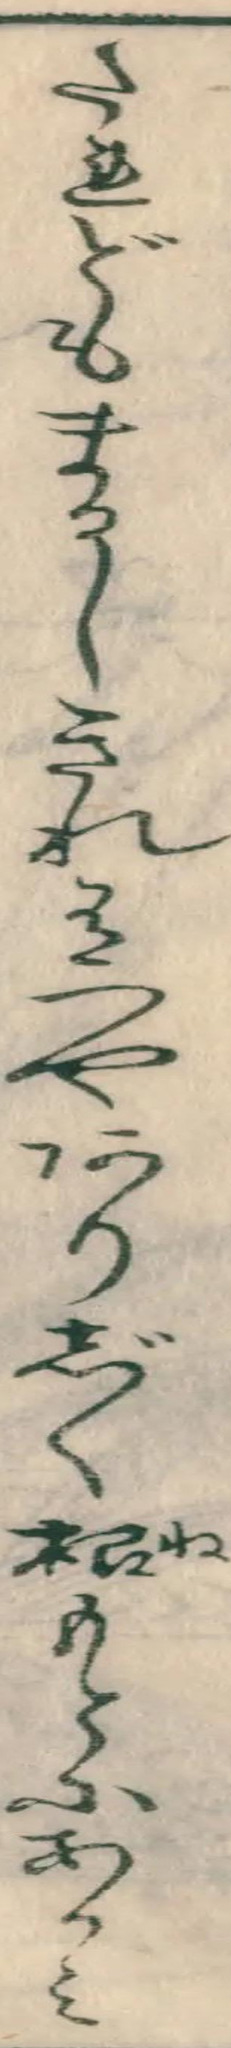たれどもまるしきれ有つやありじく根もとにあかみ
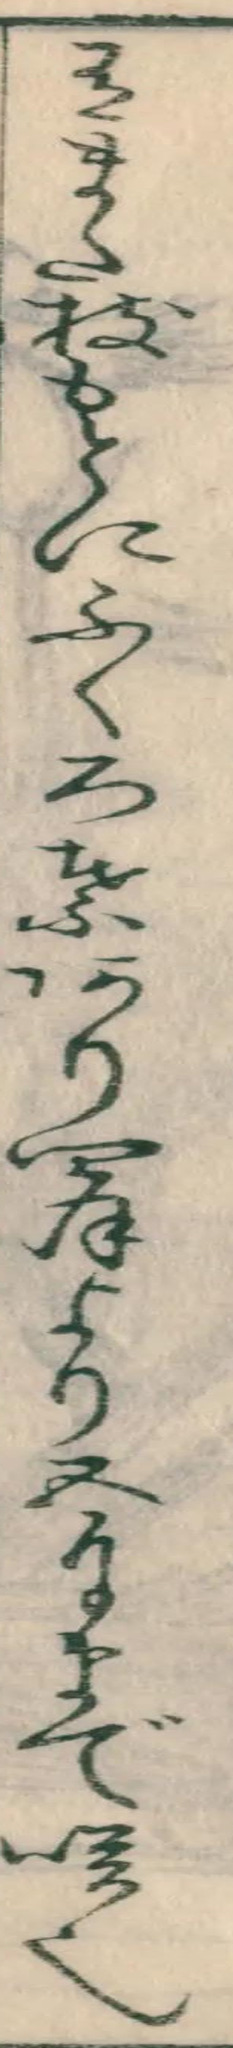有また枝もとにふくろ葉あり四月より五月まで咲也
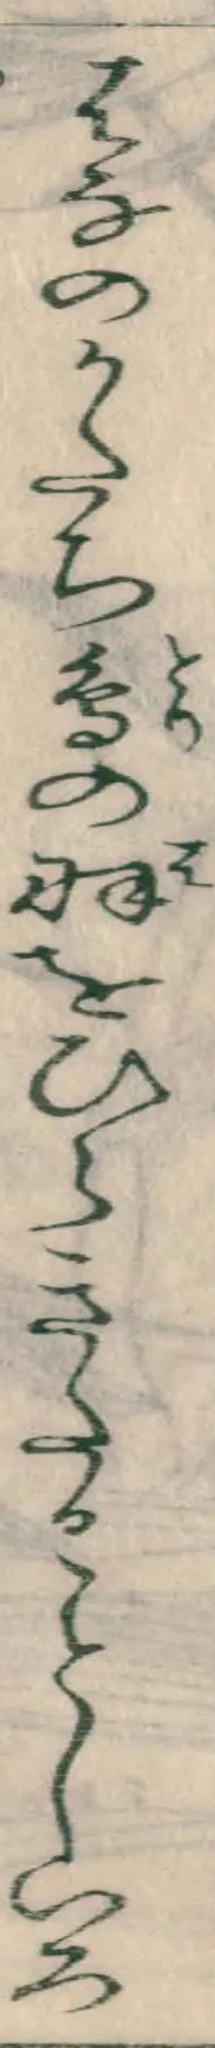はなのかたち鳥の羽をひらきたることしいろ
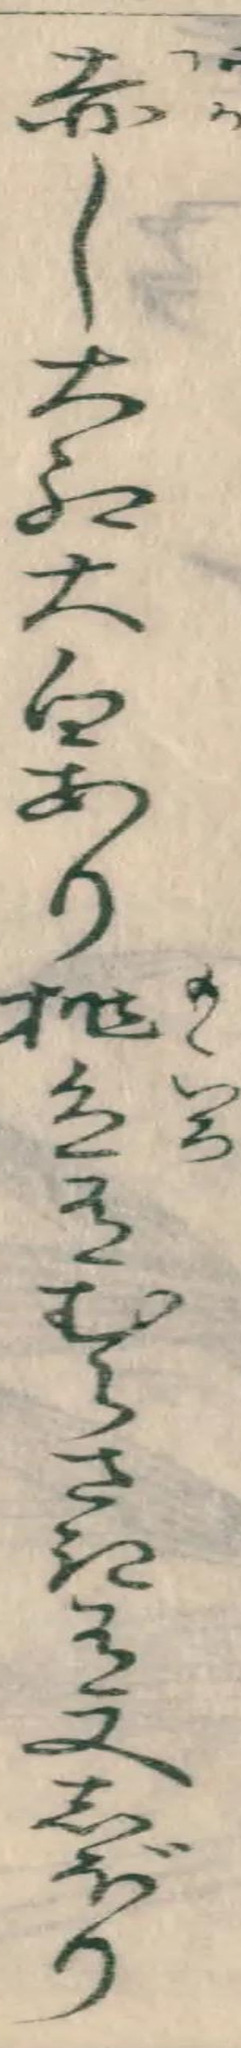赤し大紅大白あり桃色有むらさき有又しぼり
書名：畫本野山草. [4]
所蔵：国立国会図書館 National Diet Library, JAPAN
